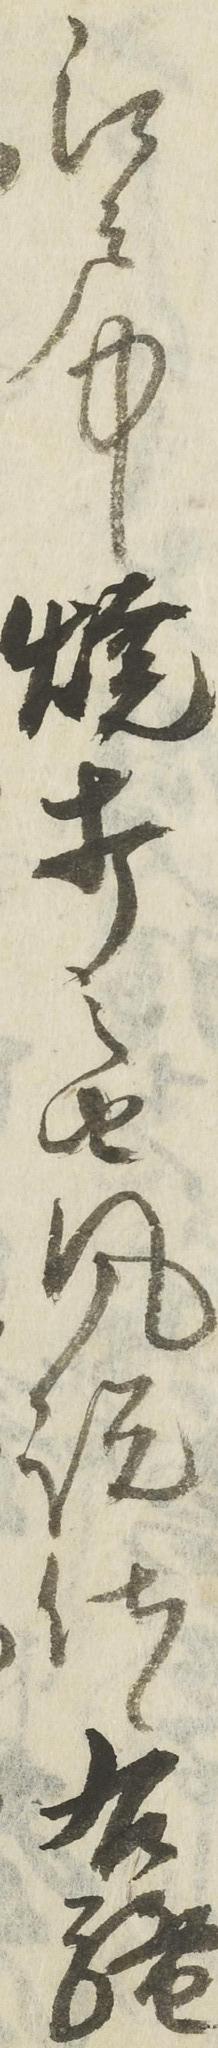江戸中焼打之由風説仕候右騒
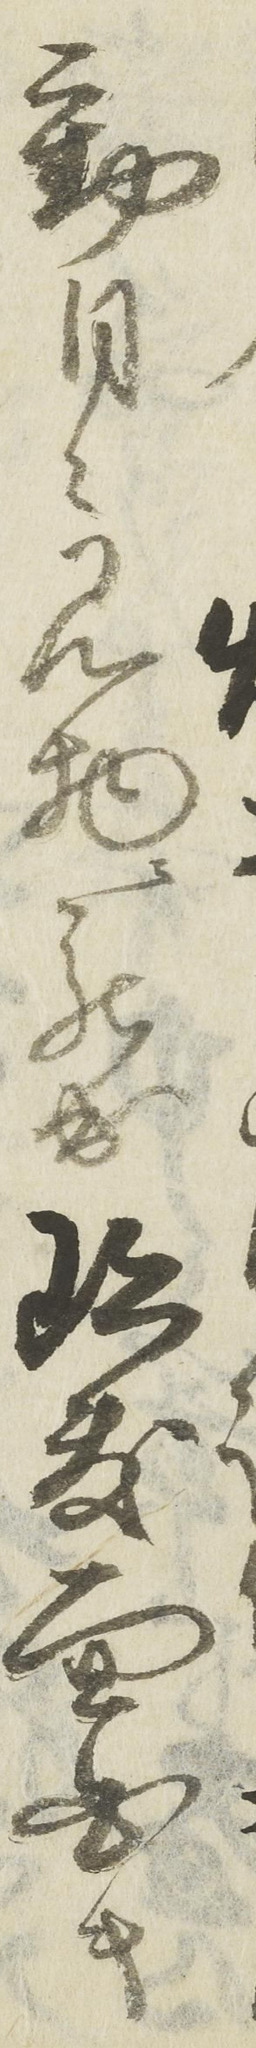動日々見物ニ罷出珍敷面白キ
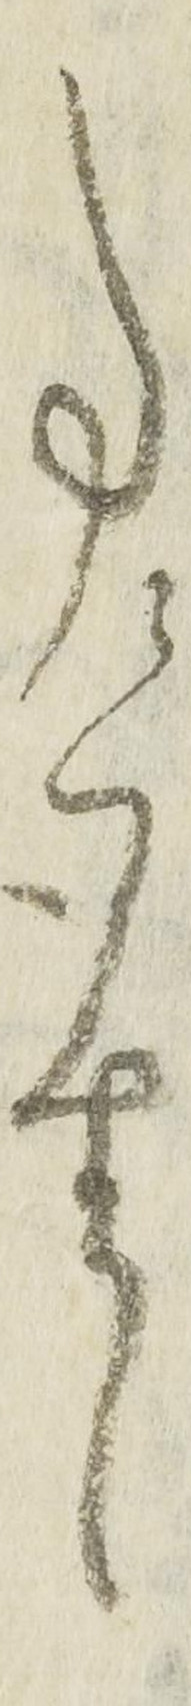事二御坐候
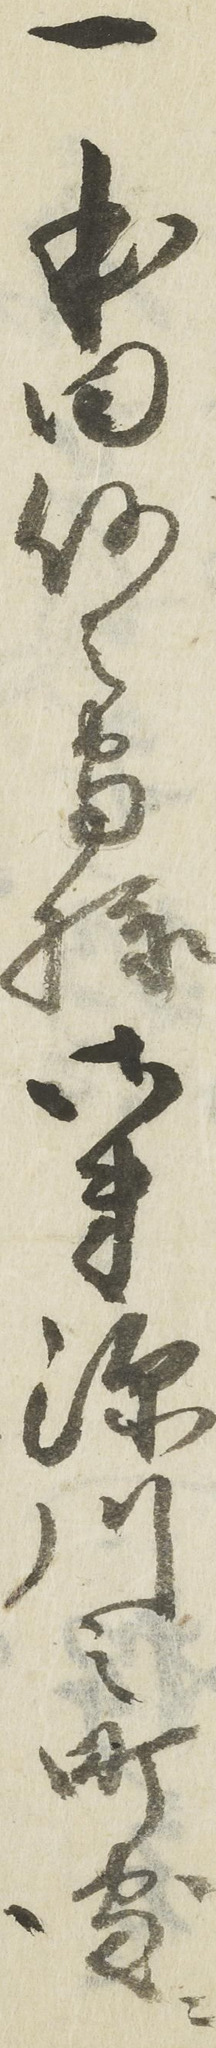一本田何之守様御弟深川之町家ニ
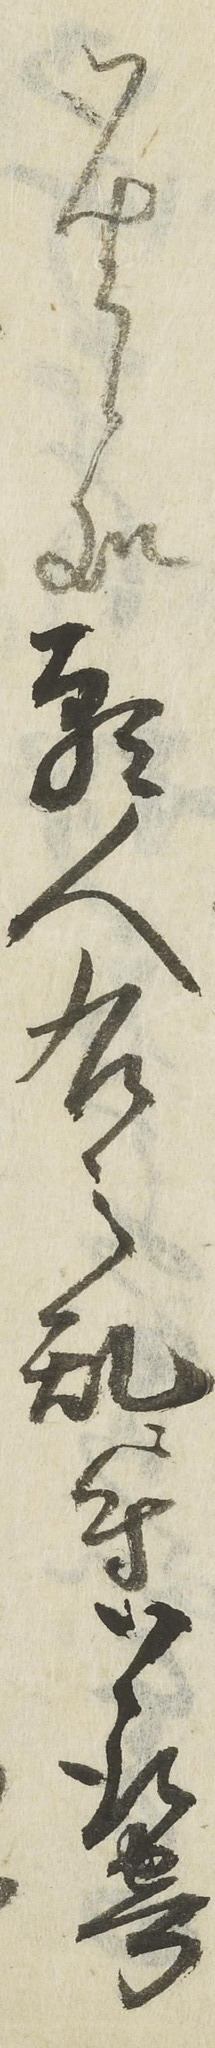御坐候処願人右之乱ニ付御取寄
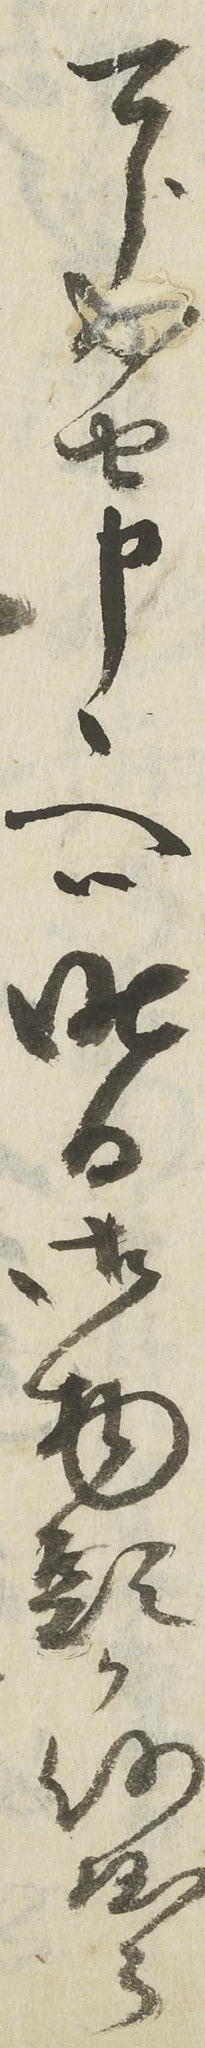可被成由申候へは昨日御物頭か何やら
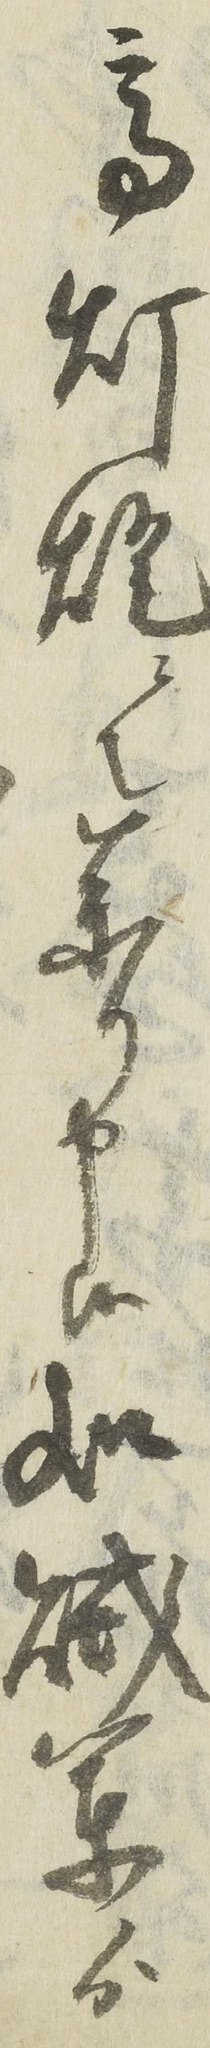高灯燈にて承り申候処賊軍ゟ
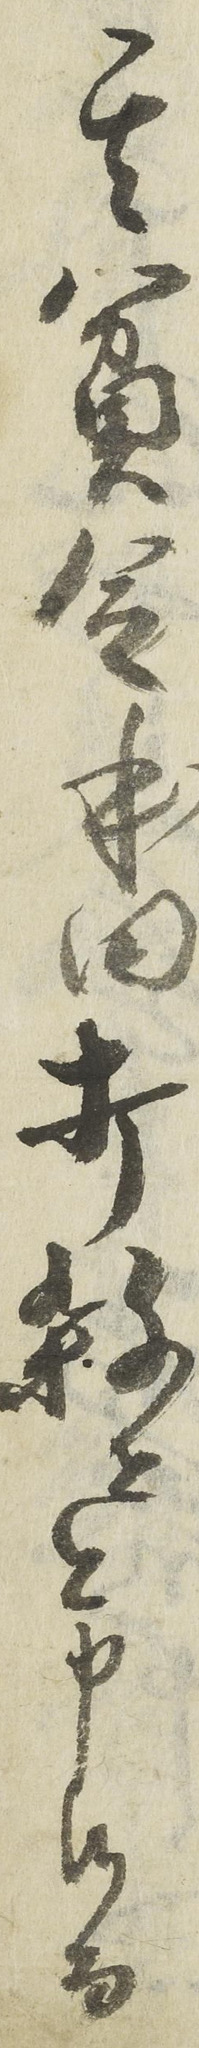其貧令本田打殺せと申候而

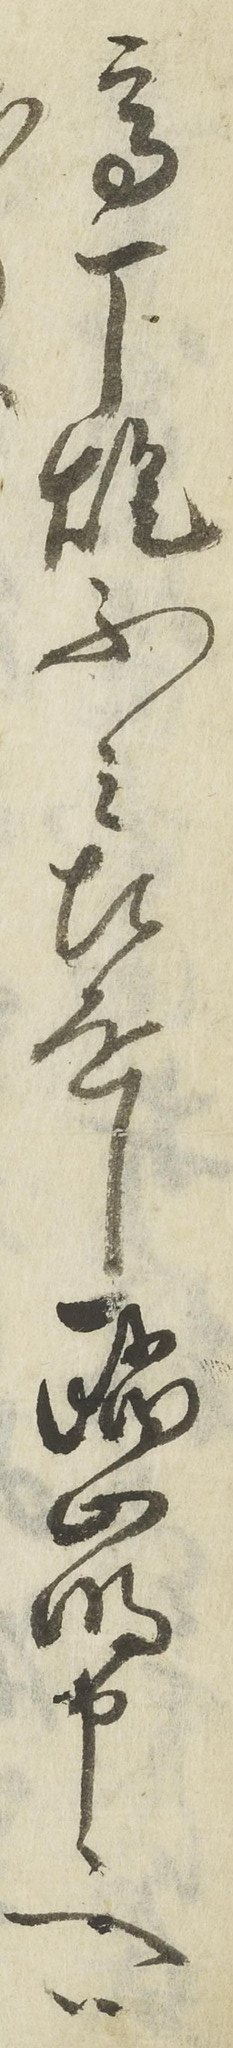高丁燈ふみたをし踏崩申候へは
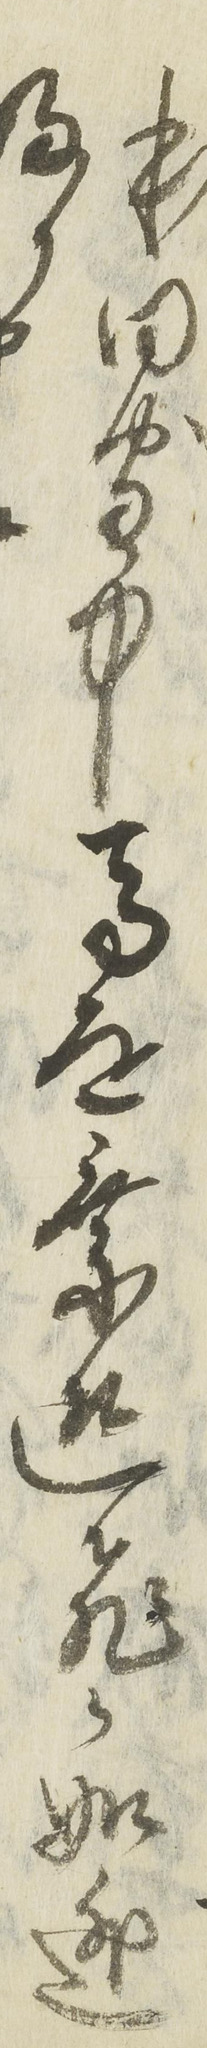本田家中馬を乗返飛か如逃
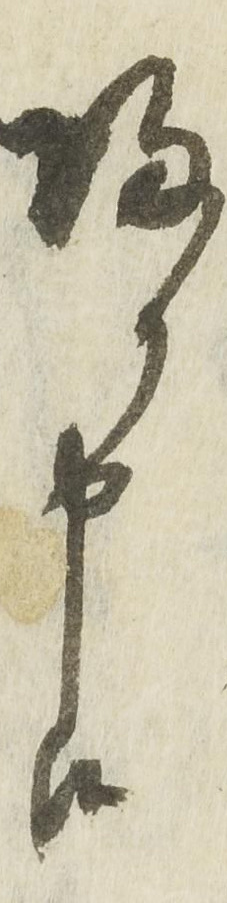帰り申候
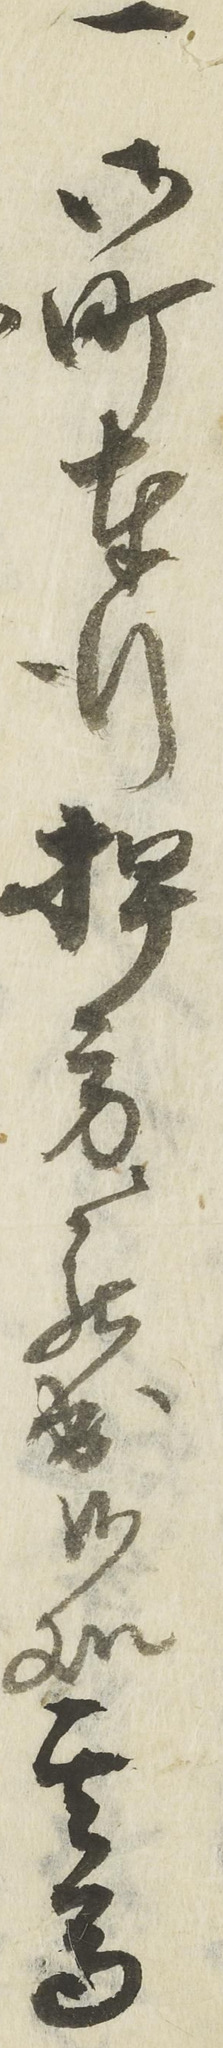一御町奉行押方ニ罷出候処其馬
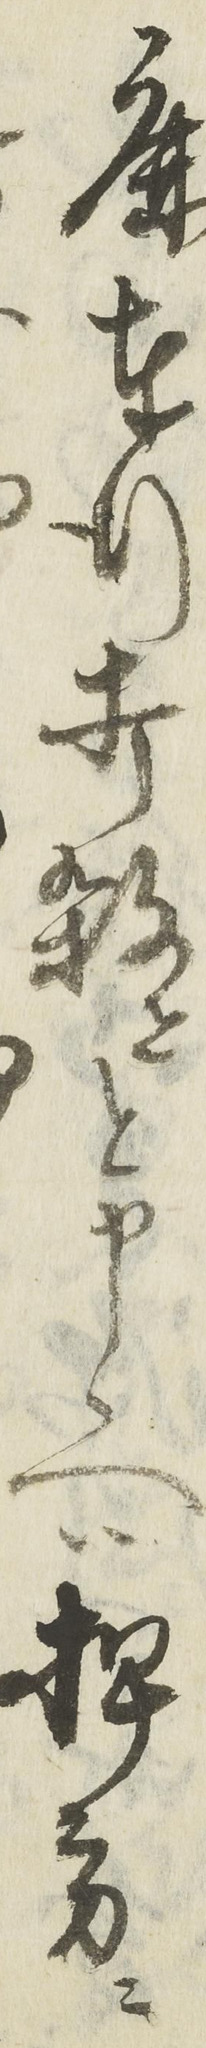鹿奉行打殺せと申候へは押方ニ
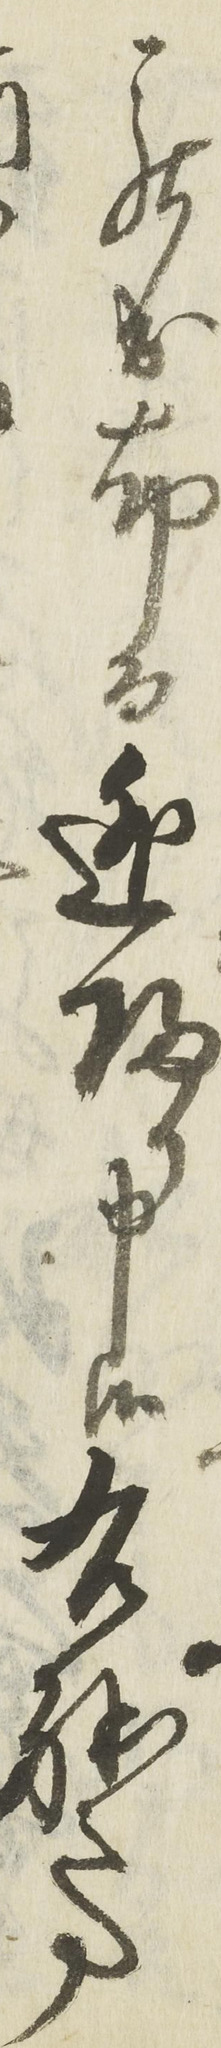罷出却而逃帰り申候右躰之事
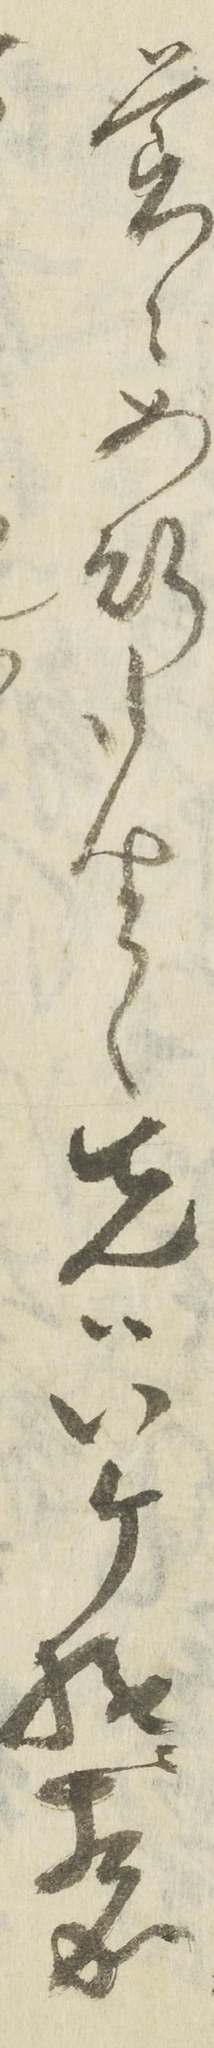前々如斯御坐候先はいケ様ニ相成
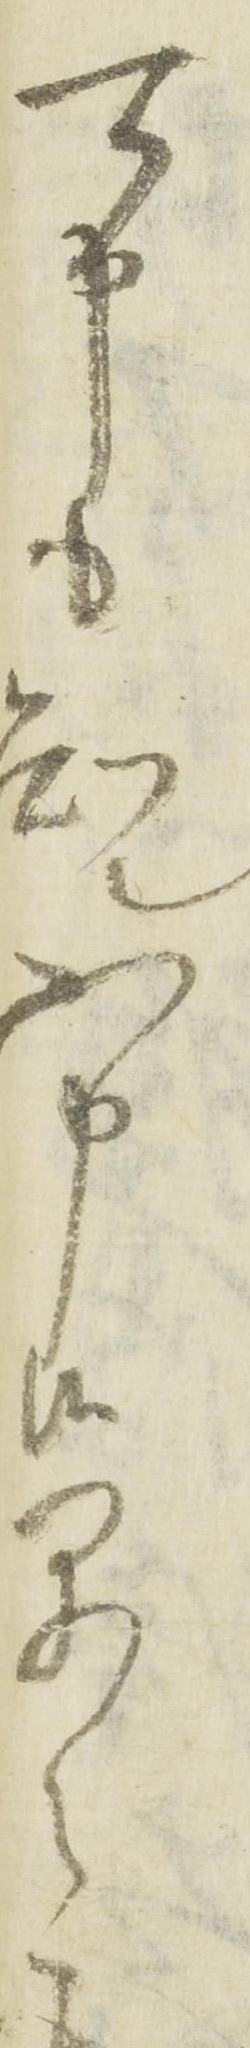可申も知レ不申候早々以上
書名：後見笑
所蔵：東京大学地震研究所図書室 Earthquake Research Institute Library, The University of Tokyo, JAPAN
